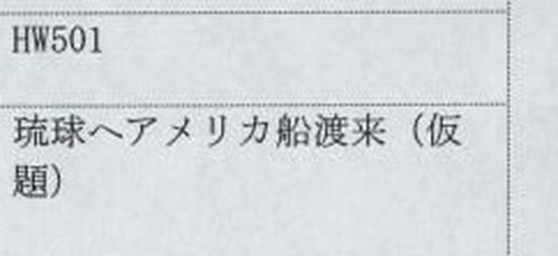琉球へアメリカ船渡来書
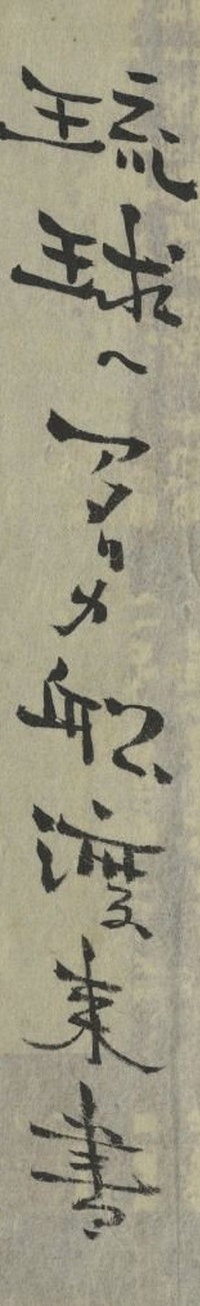琉球へアメリカ船渡来書

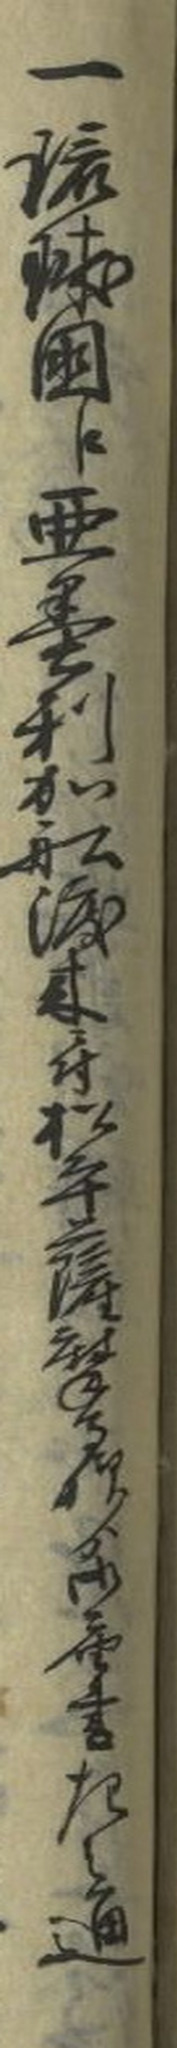一琉球国え亜墨利加船渡来に付松平薩摩守様ゟ御届書左之通
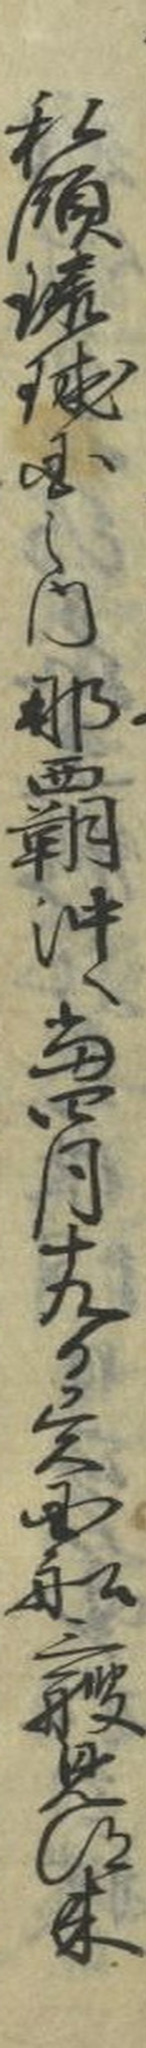私領琉球国之内那覇沖へ当四月十九日異国船三艘見得来
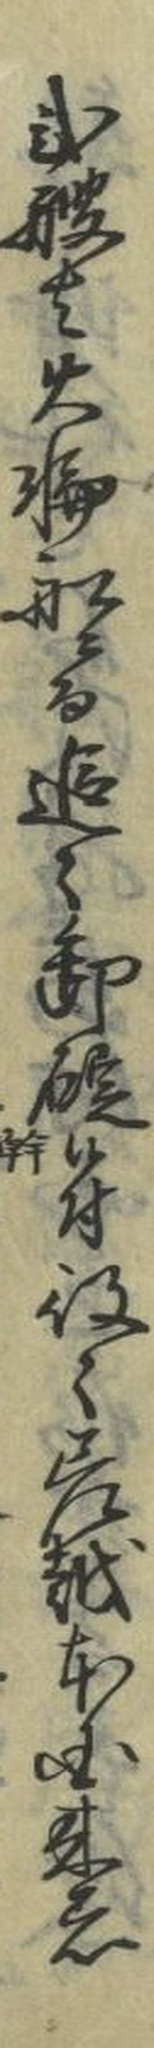弐艘は火輪船に而追々卸碇候付役々差越本国来着
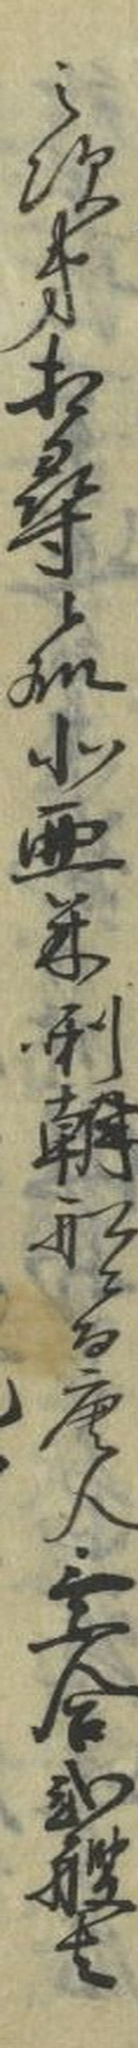之次第相尋候処北亜米唎加朝船に而唐人乗合弐艘は
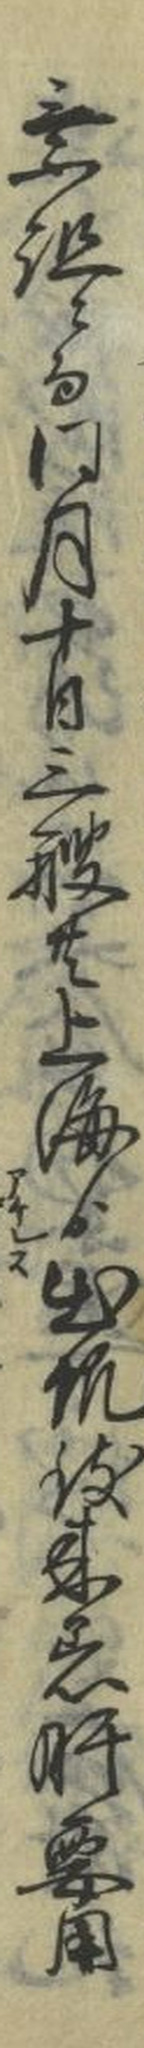乗組に而同月十日三艘共上海ゟ出帆致来着肝要用
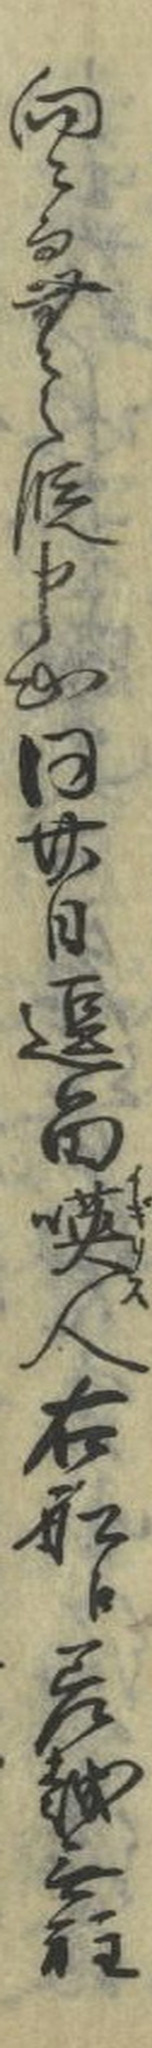向に而無之段申出同廿日逗留𠸄】人右船え差越無程
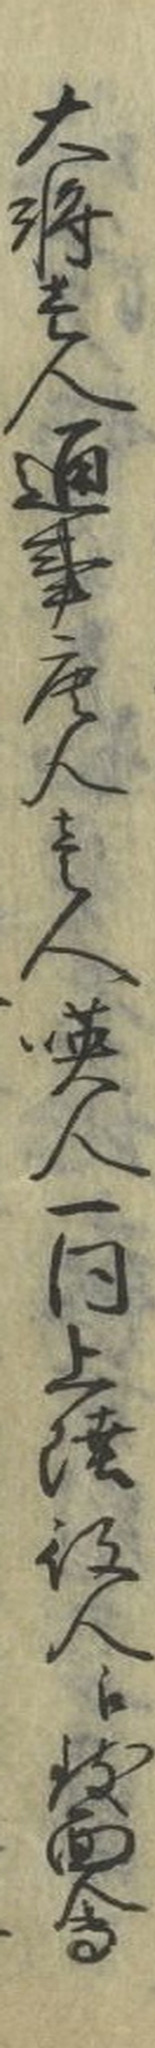大将壱人通事唐人壱人𠸄人一同上陸役人え致面会
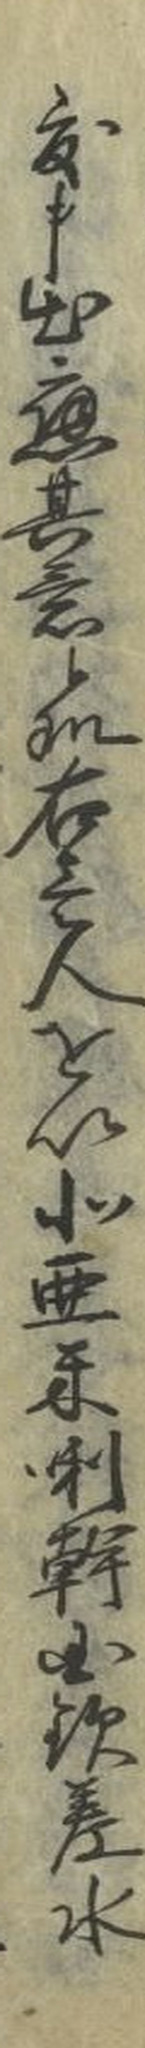度申出応其意候処右壱人を以北亜米唎幹国欽差水
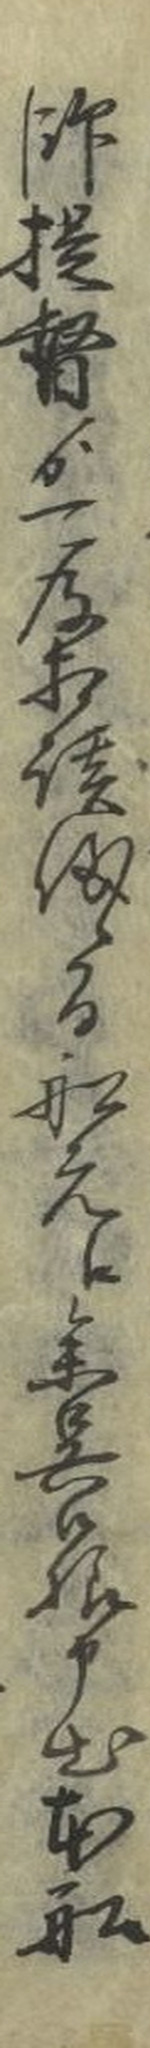師提督ゟ可為相談儀候間船元え参呉候様申出本船
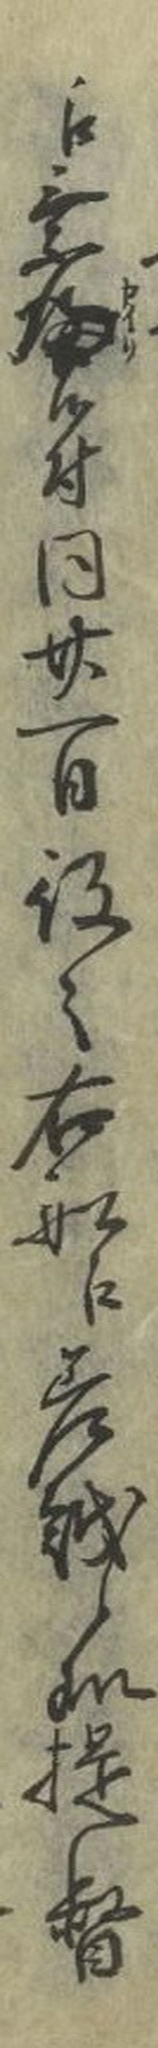え乗帰候付同廿一日役々右船え差越候処提督
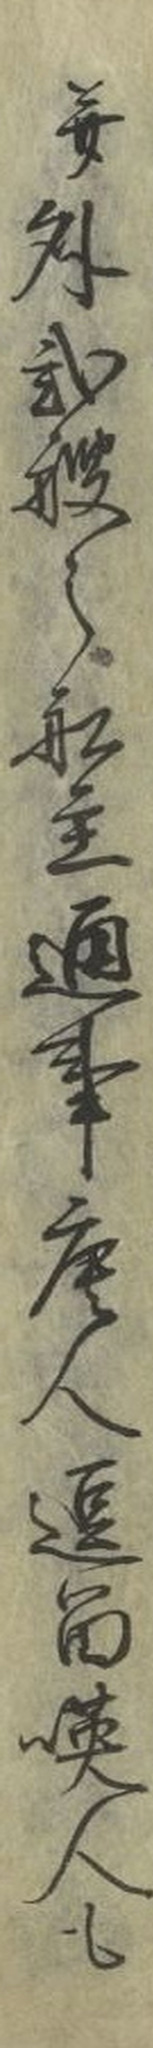幷外弐艘之船主通事唐人逗留𠸄人も

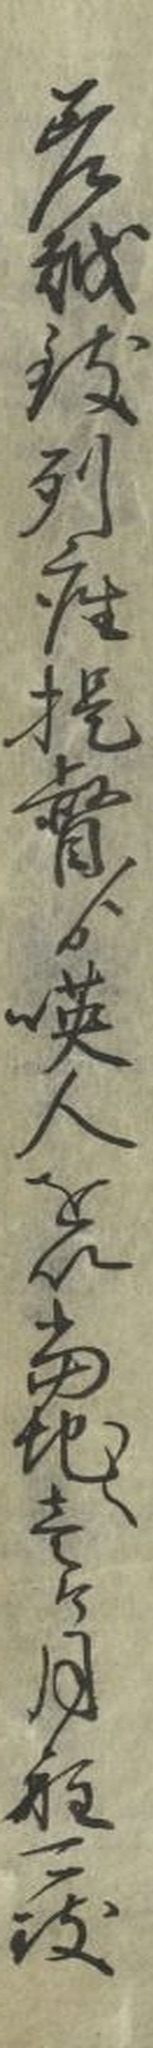差越致列座提督ゟ𠸄人を以当地へ壱ヶ月程可致
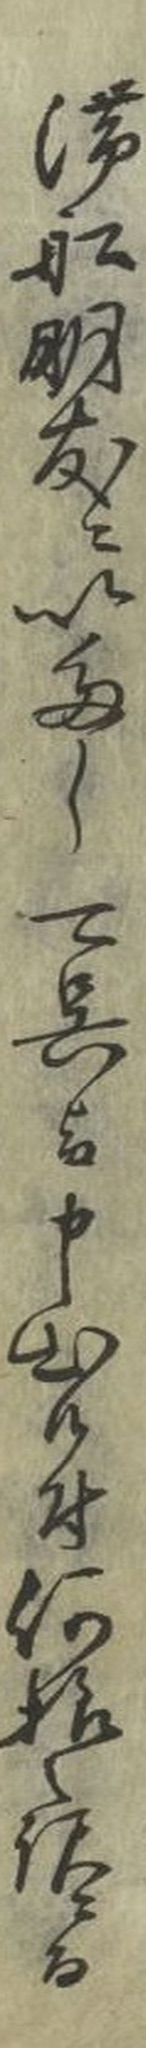滞船朋友にいたし可呉旨申出候付何様之訳に而
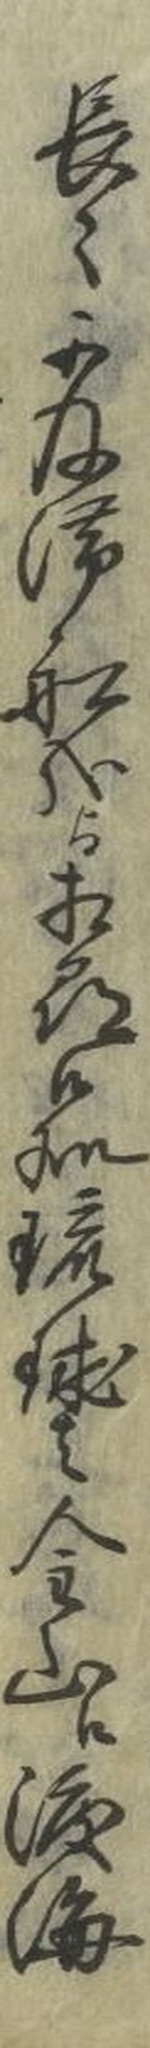長々可為滞船哉と相尋候処琉球は金山え渡海
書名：琉球へアメリカ船渡来書
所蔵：University of the Ryukyus Library
